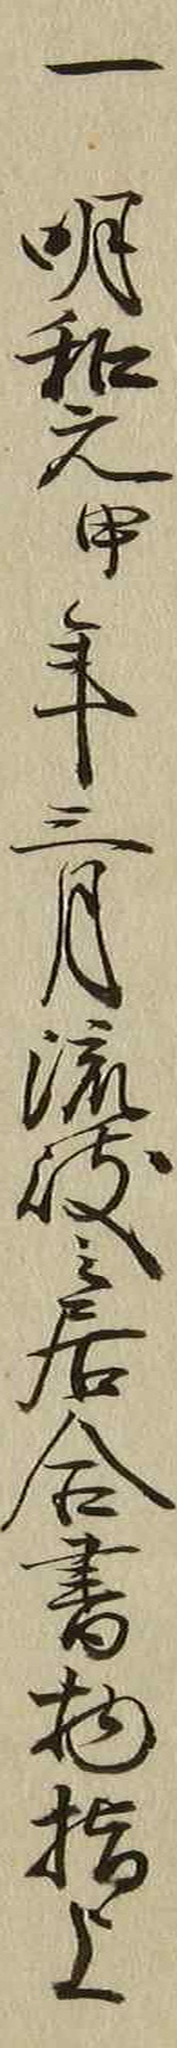一明和元申年三月流岐之居合書物指上
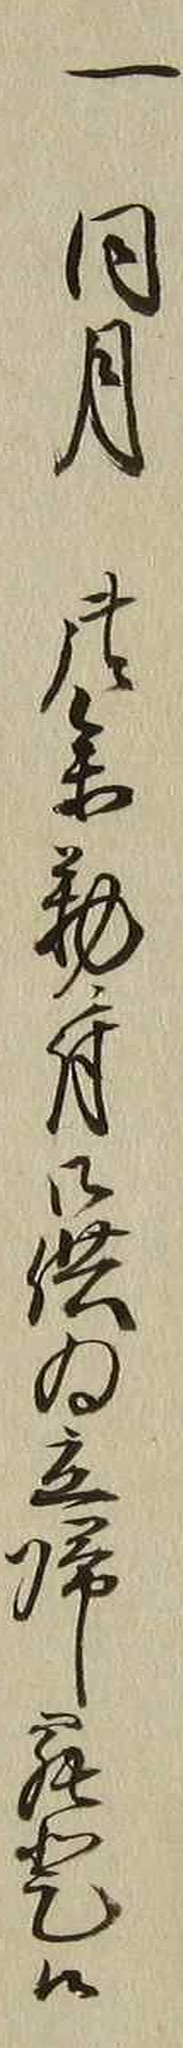一同月御参勤に付御供為立帰罷登候
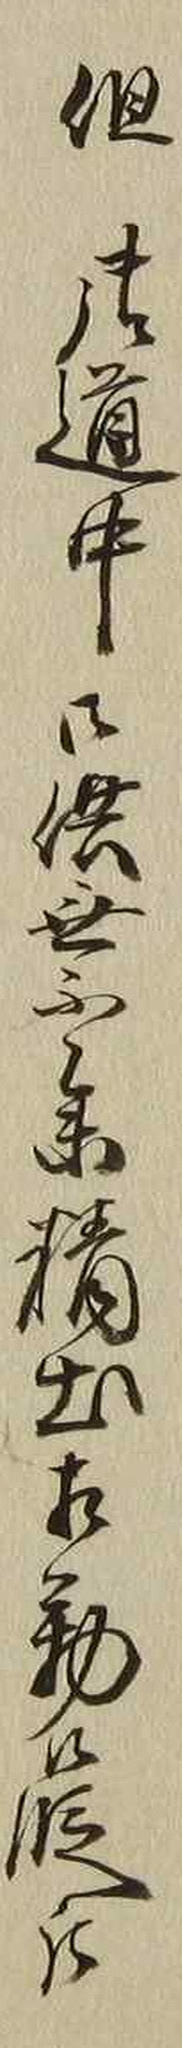但御道中御供無不参精出相勤候段被
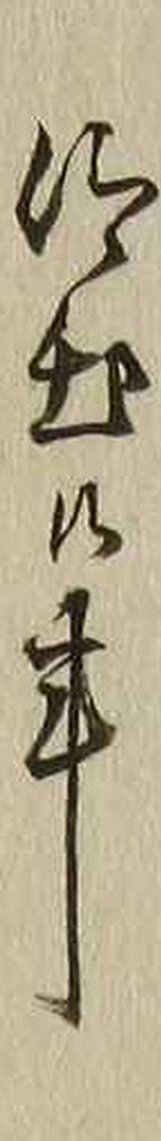仰出候事
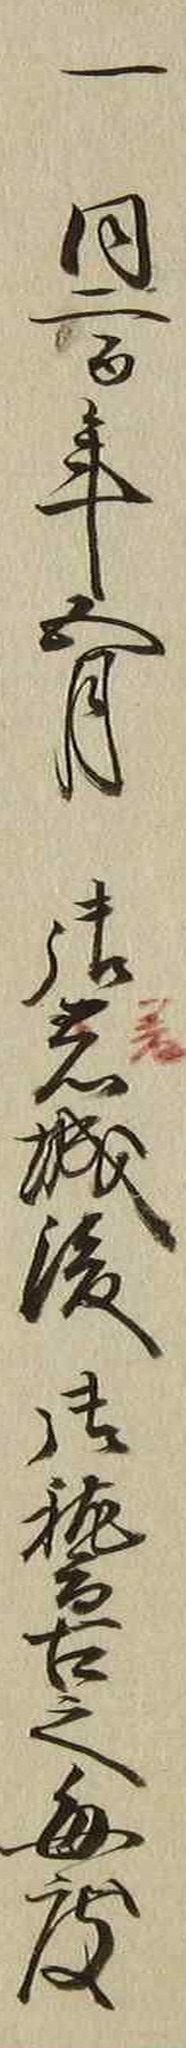一同二酉年五月御着城後御稽古之毎度
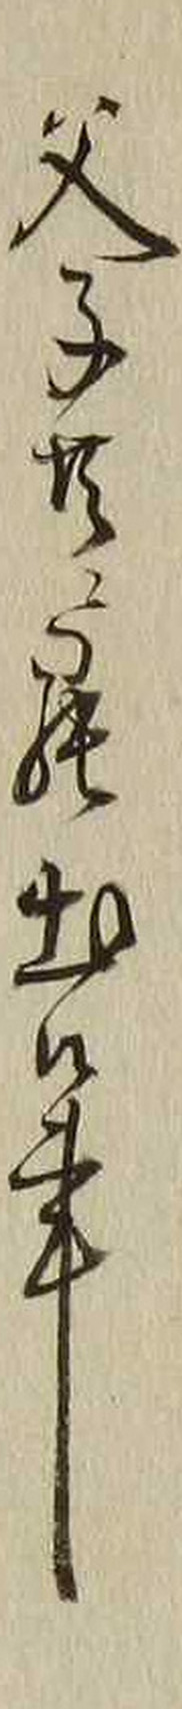父子共に罷出候事
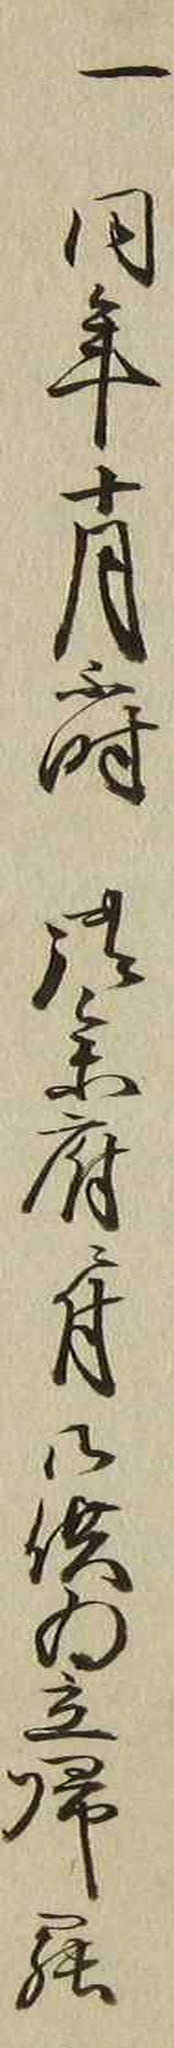一同年十月不時御参府に付御供為立帰罷
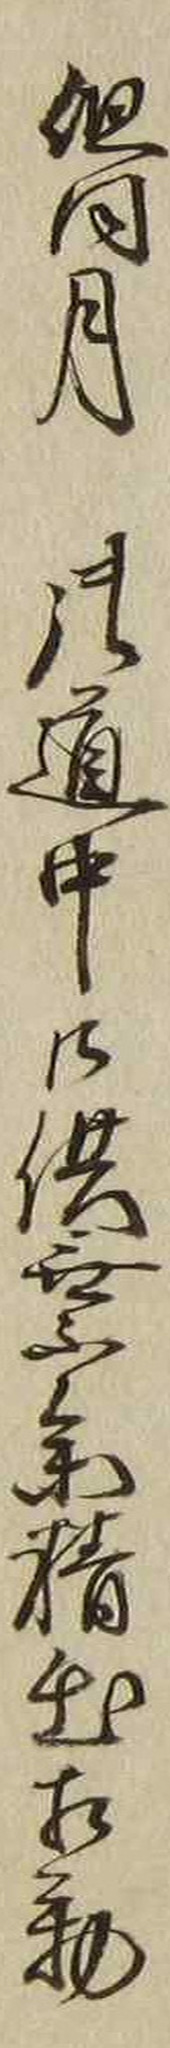但同月御道中御供無不参精出相勤
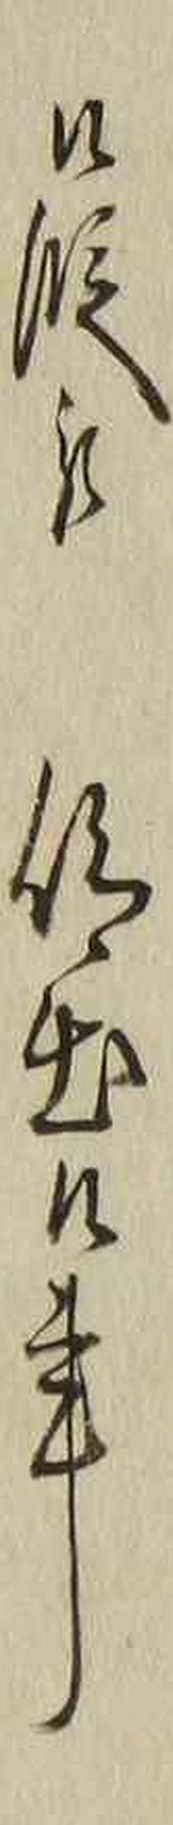候段被仰出候事
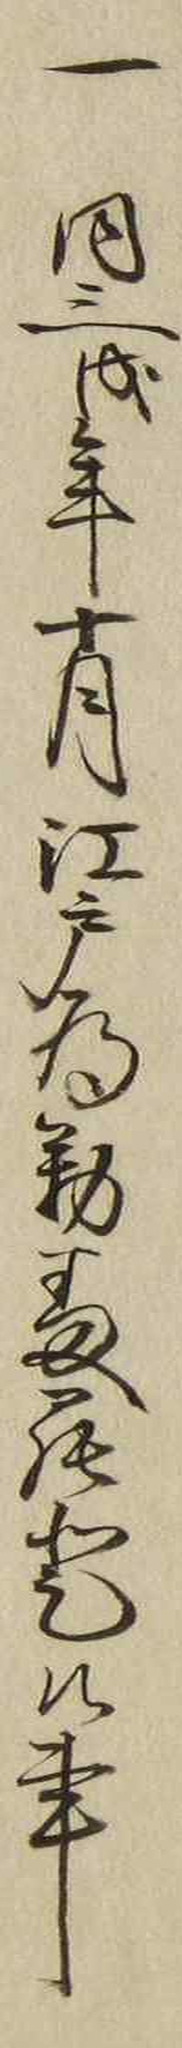一同三戊年十月江戸為勤番罷登候事

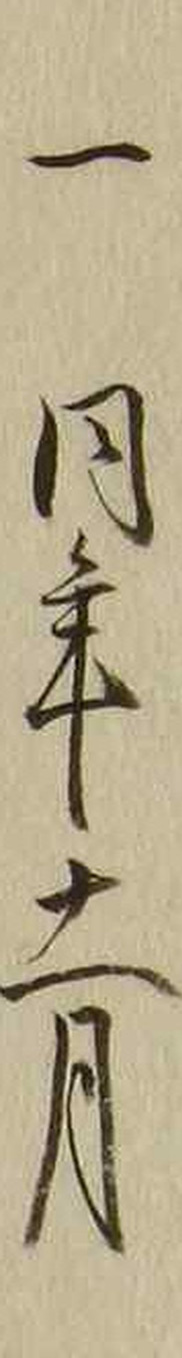一同年十一月
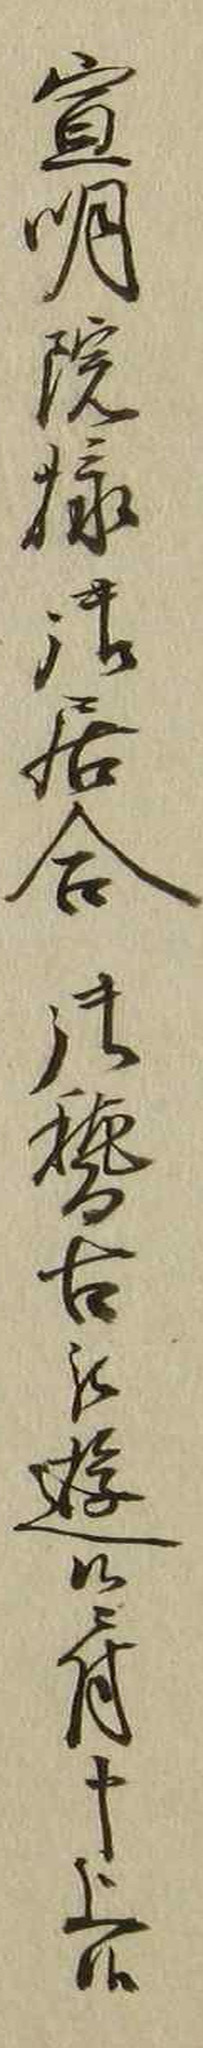宣明院様御居合御稽古被遊候ニ付申上候
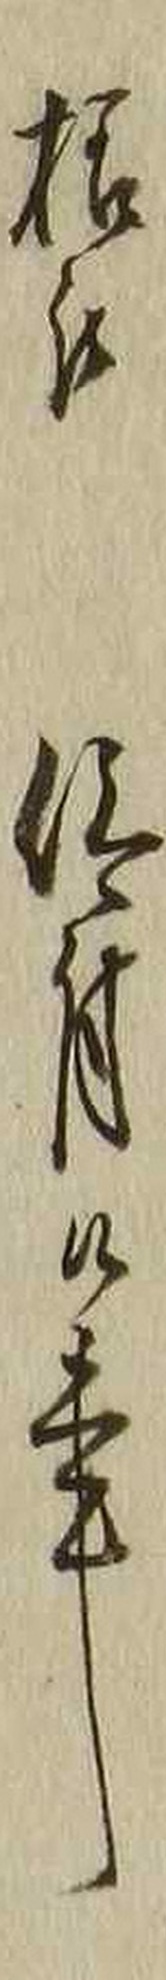様被仰付候事
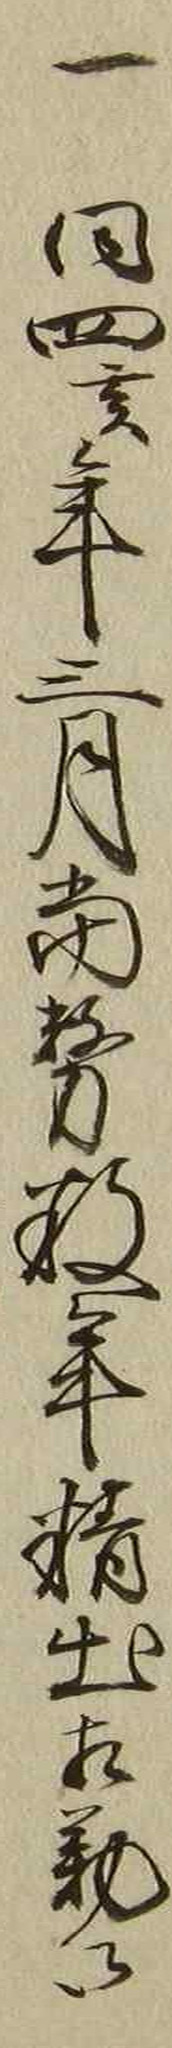一同四亥年三月当務数年精出相勤御
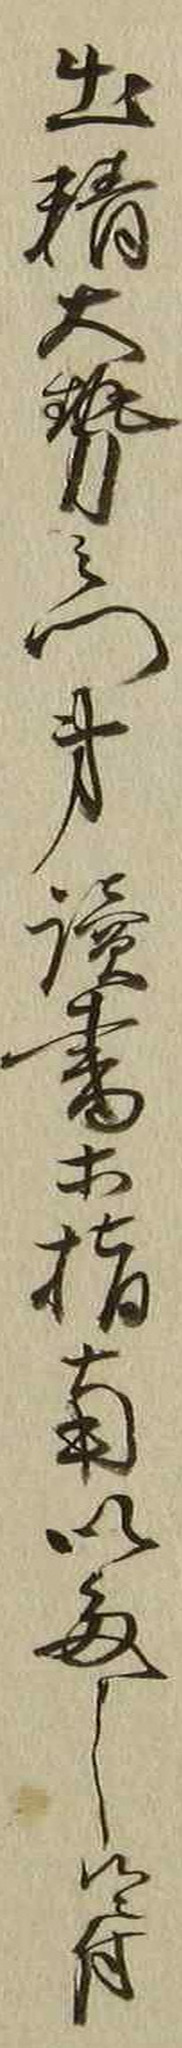出精大勢之門弟読書等指南いたし候ニ付
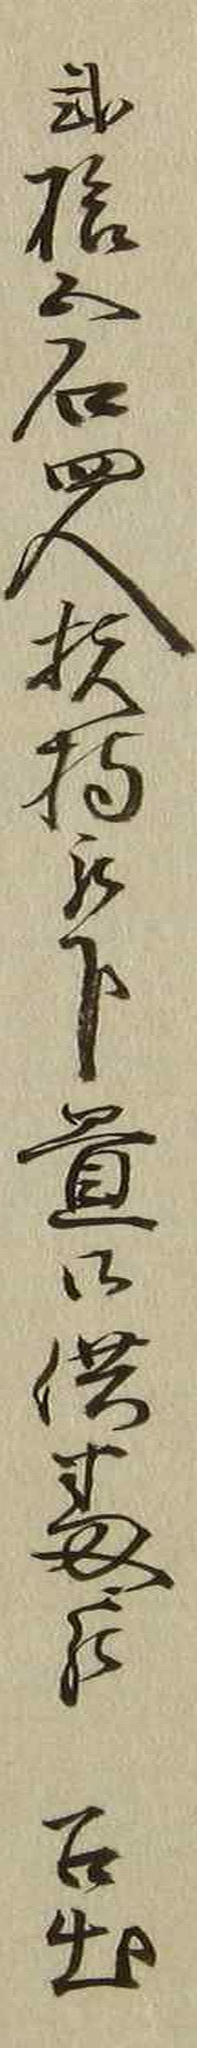弐拾五石四人扶持被下置御供番ニ被召出
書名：諸士系譜　巻之67　を之部1
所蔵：会津若松市立会津図書館
